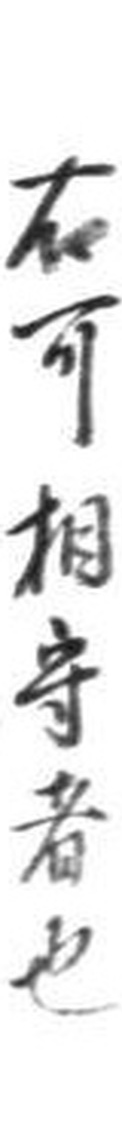右可相守者也
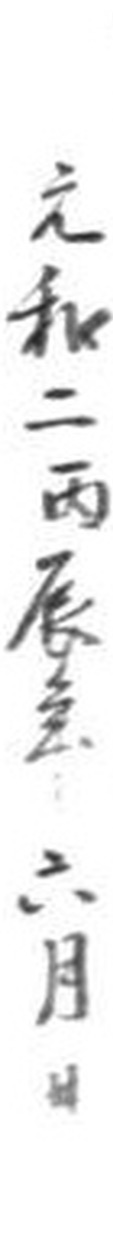元和二丙辰年六月日

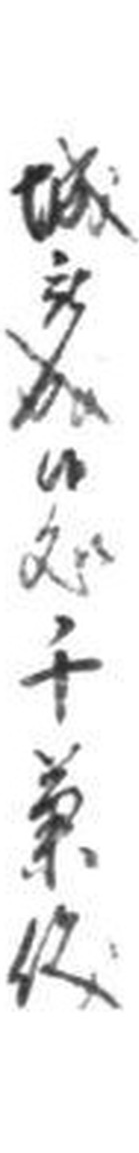城被成候処千菊儀
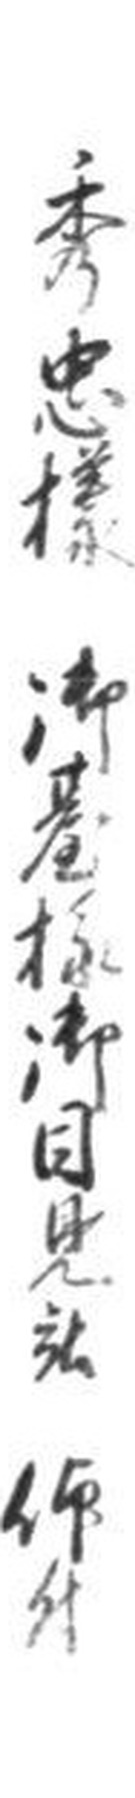秀忠様御台様御目見被仰付
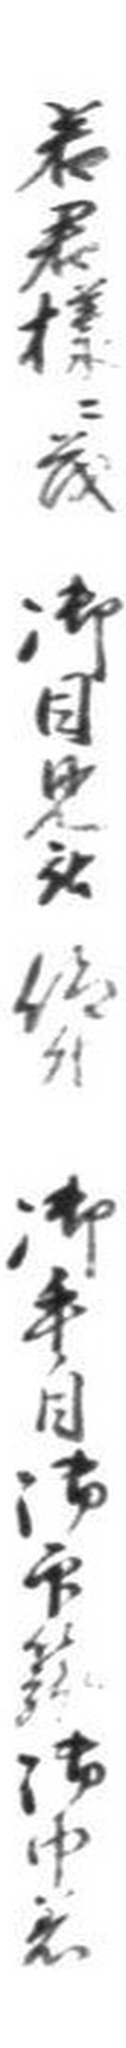若君様ニ茂御目見被仰付御手自御印籠御巾着
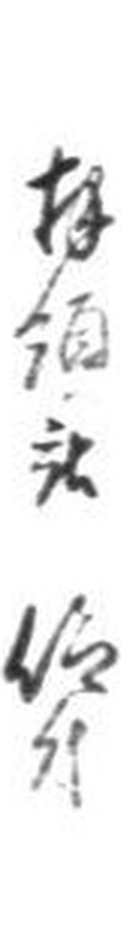拝領被仰付
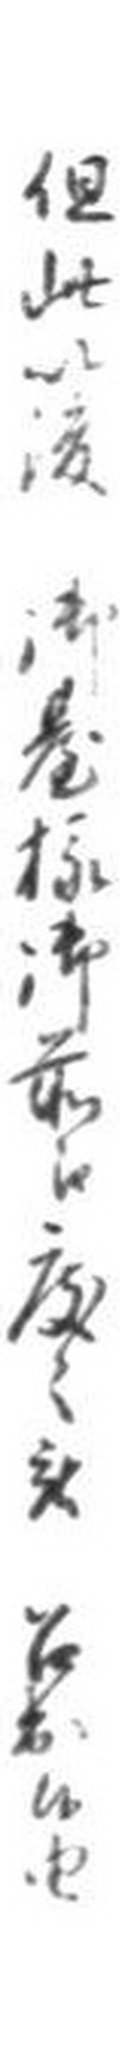但此以後御台様御前江度々被召出候由
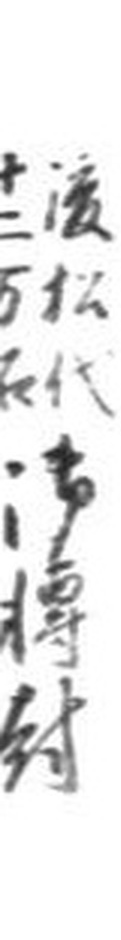十二万石御転封

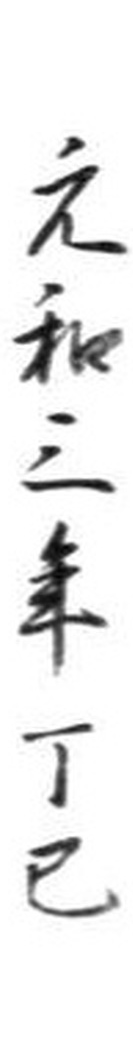元和三年丁巳
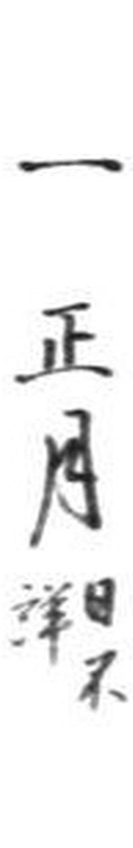一三月九日
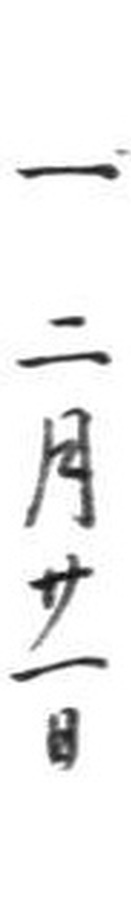一二月廿一日
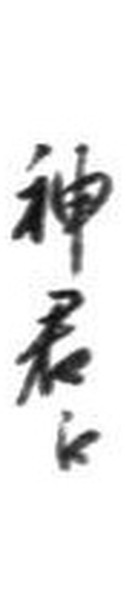神君江
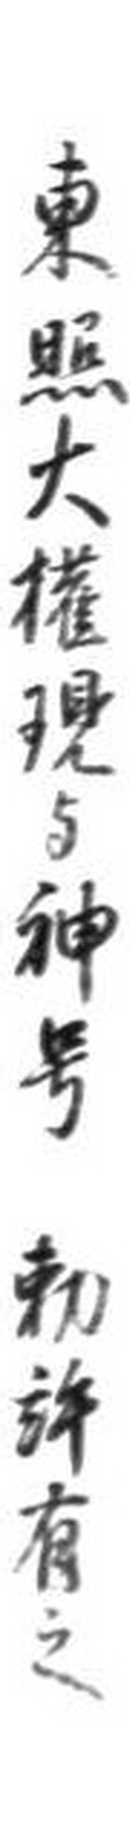東照大権現与神号勅許有之
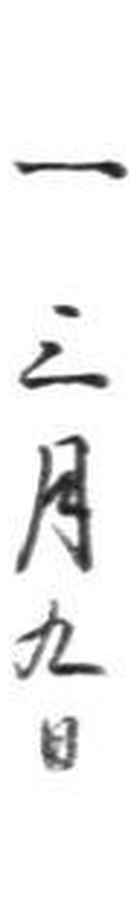一三月九日
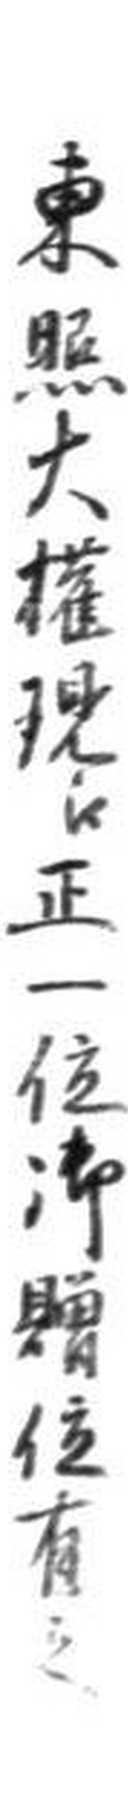東照大権現江正一位御贈位有之

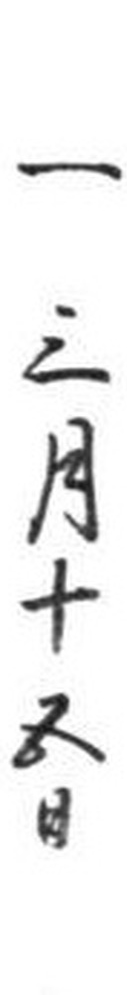一三月十五日
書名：家譜 二 忠直公 従文禄四年到慶安四年
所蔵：福井県文書館 Fukui Prefectural Archives
